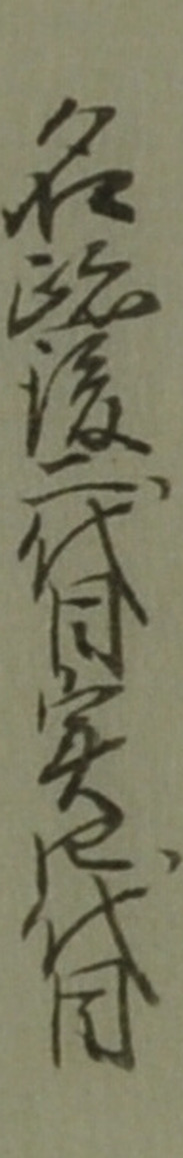名跡後二代目実四代目
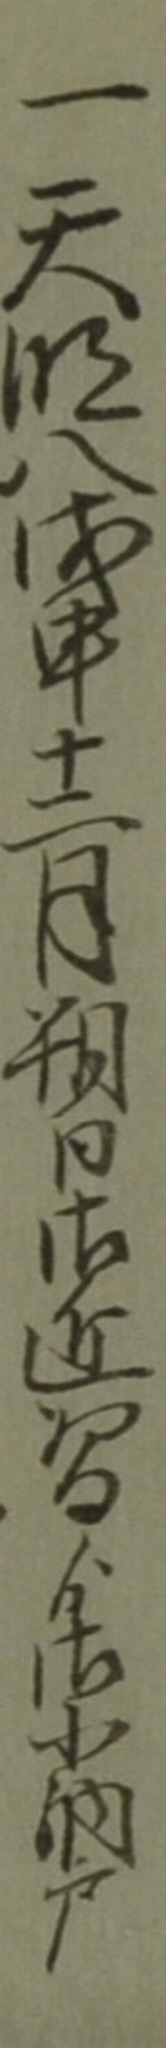一天明八戊申十二月朔日御近習ゟ御小納戸
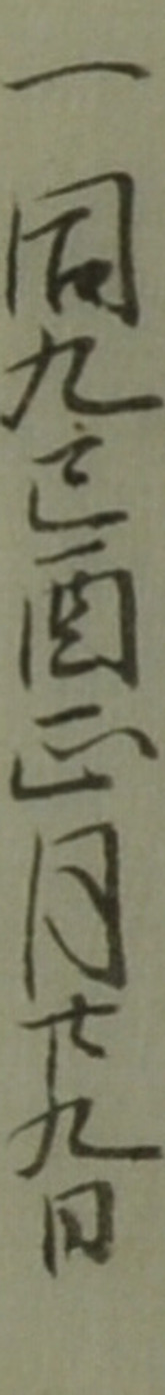一同九己酉正月廿九日
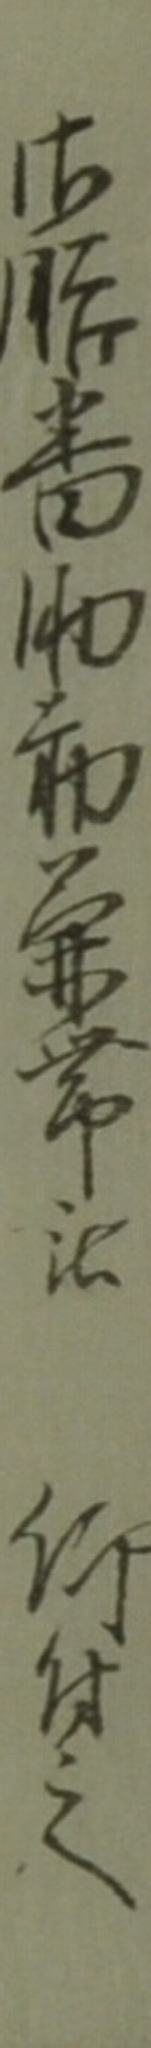御膳番助勤兼帯被仰付之
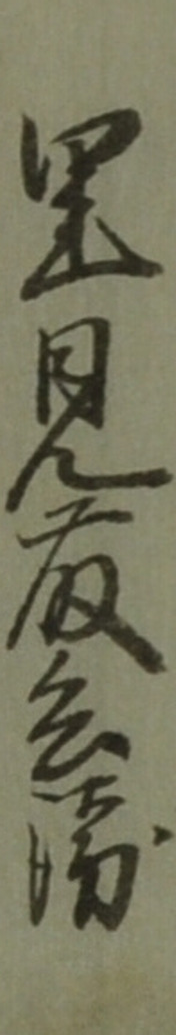里見藤兵衛
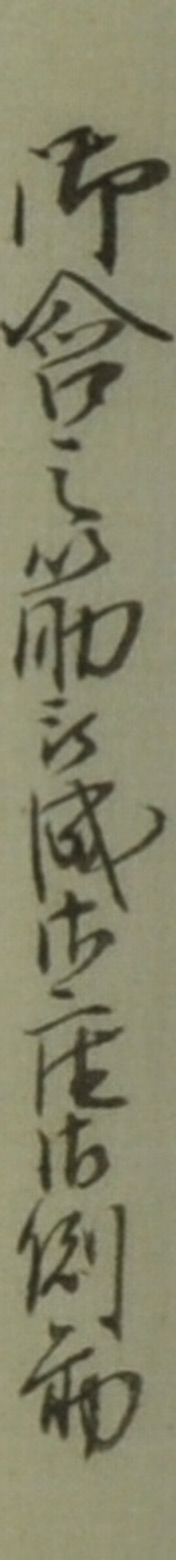御含之筋被成御座御側勤

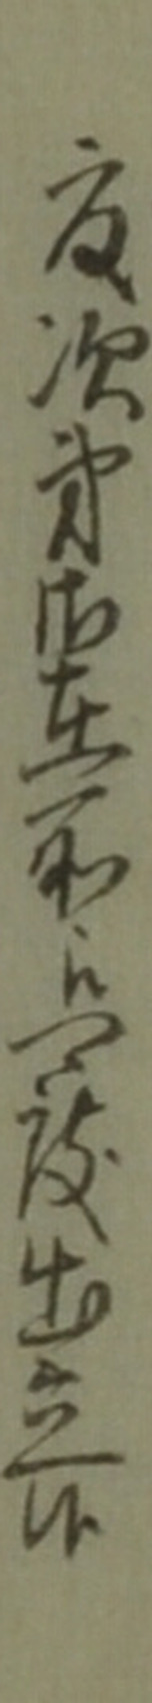度次第御在所江可致出立候
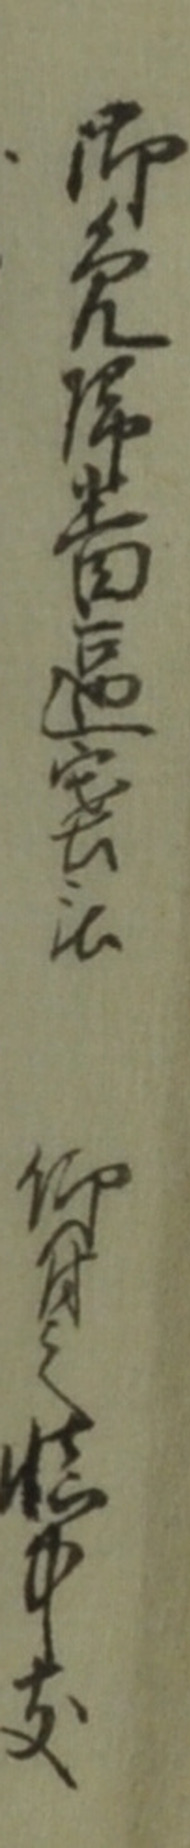御免帰番逼塞被仰付之慎中支

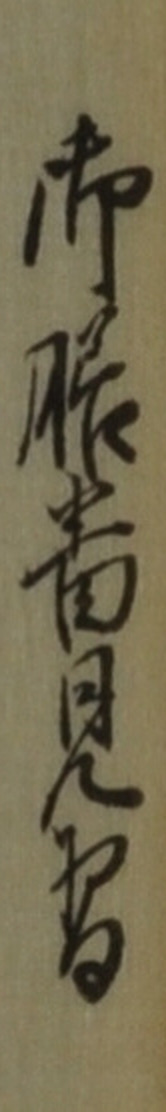御膳番見習
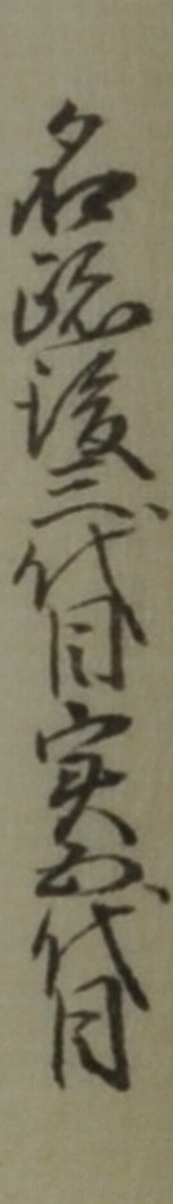名跡後三代目実五代目
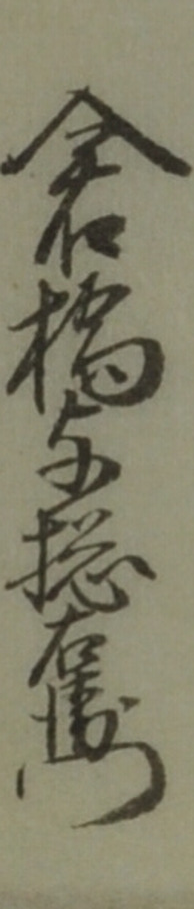倉橋与捴右衛門
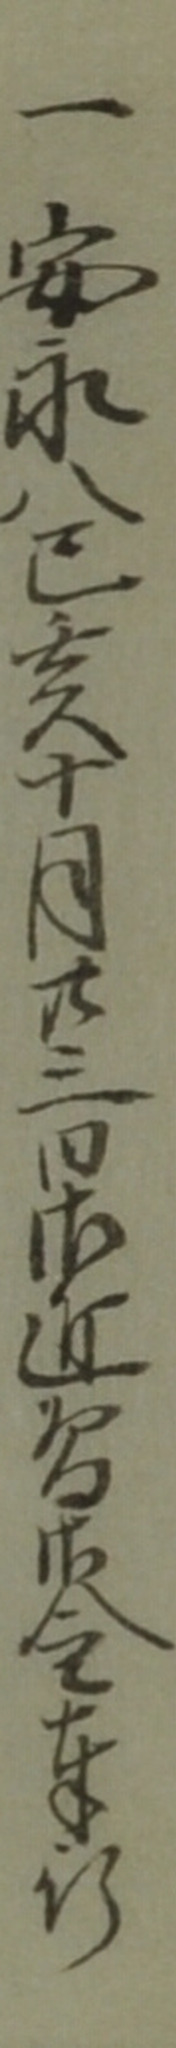一安永八己亥十月廿三日御近習御金奉行
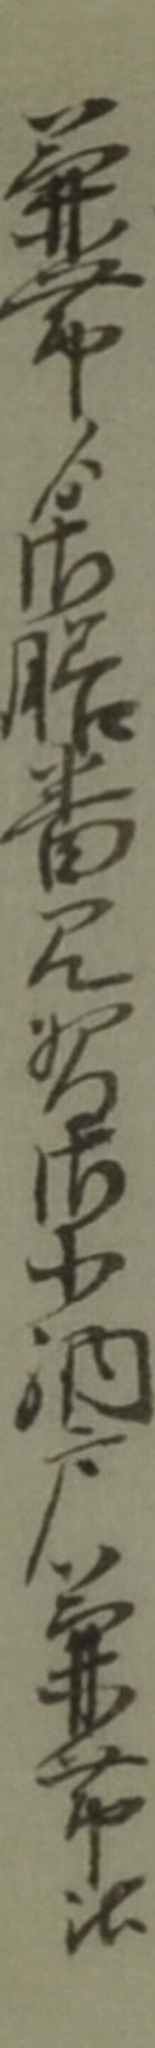兼帯ゟ御膳番見習御小納戸兼帯被
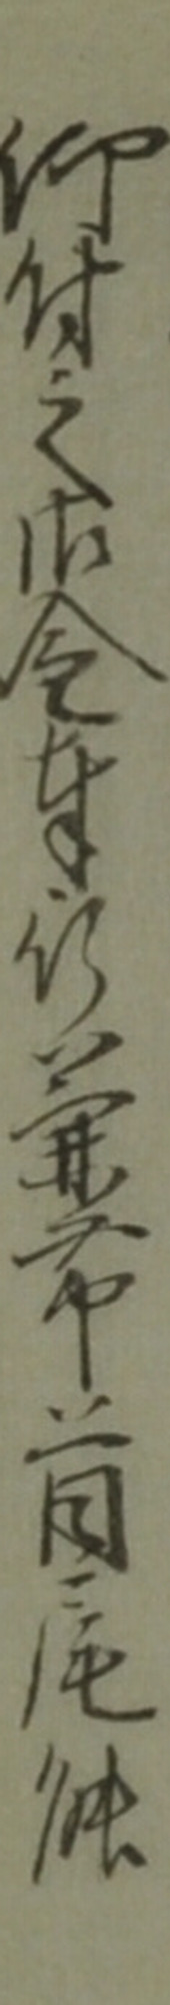仰付之御金奉行兼帯首尾能
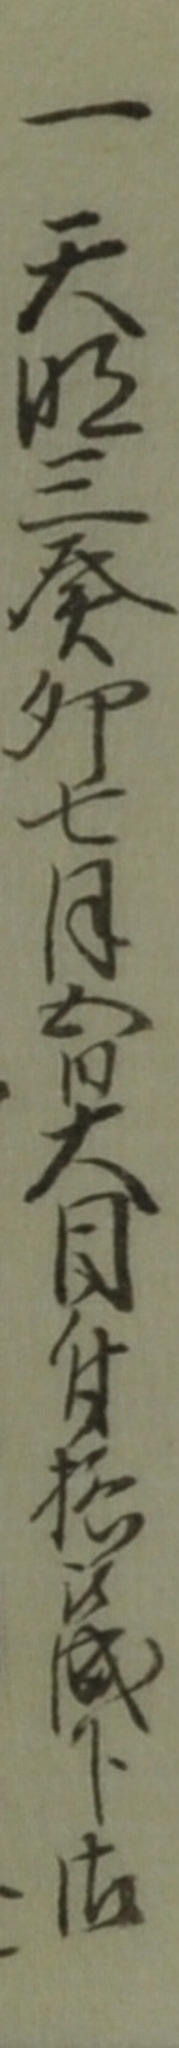一天明三癸卯七月五日大目付格被成下御
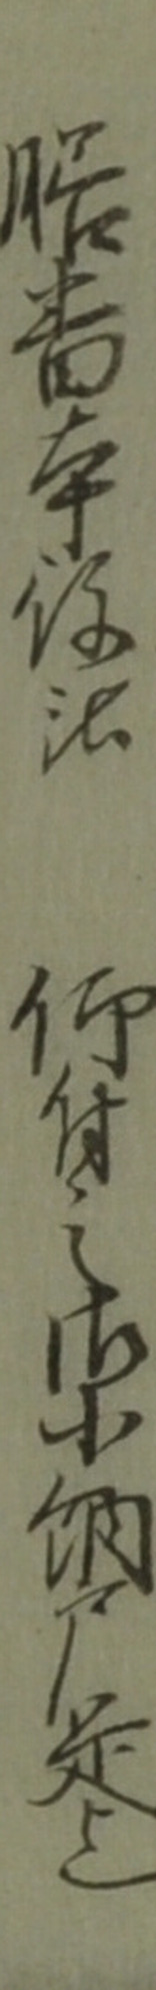膳番本役被仰付之御小納戸是迄
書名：諸御役代々録（四）
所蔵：伊那市立高遠町図書館・合同会社AMANE
